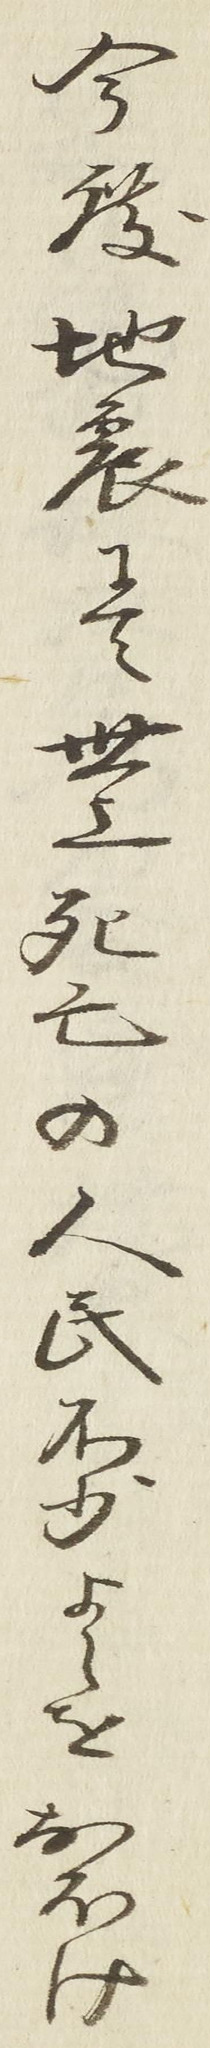今度地震にて世上死亡の人民不少よしをおほけ
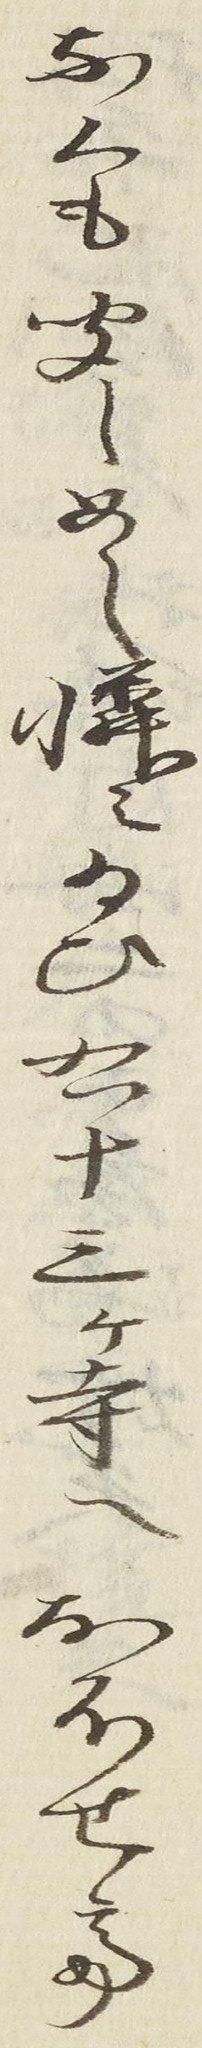なくも聞しめし憐み給ひ右十三ケ寺へおほせて
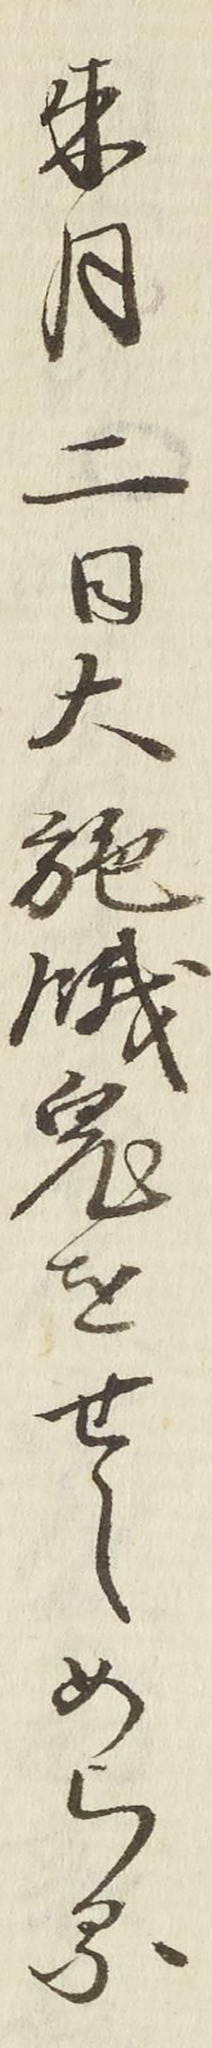来月二日大施餓鬼をせしめらる
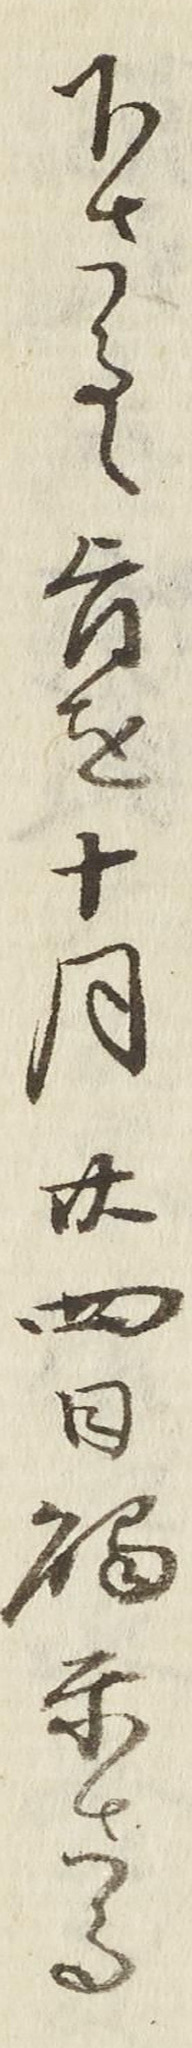下さるゝ旨を十月廿四日觸示さる
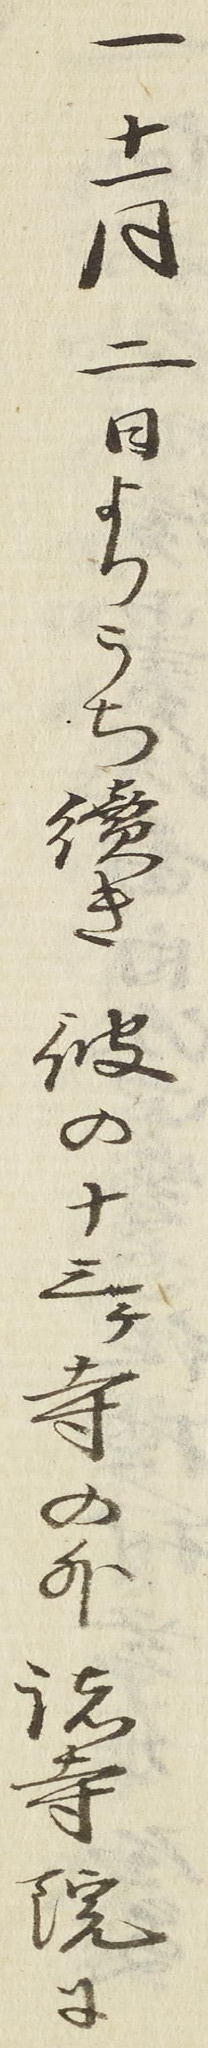一十一月二日よりうち続き彼の十三ケ寺の外諸寺院に
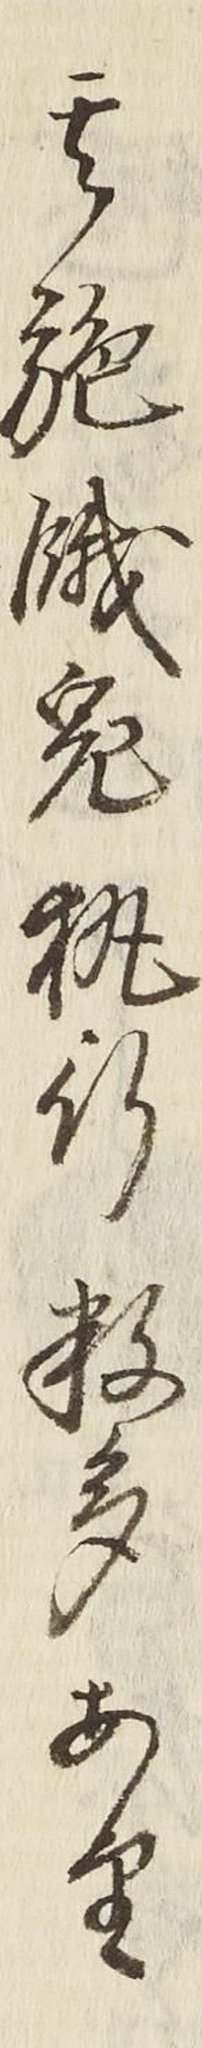其施餓鬼執行数多あり
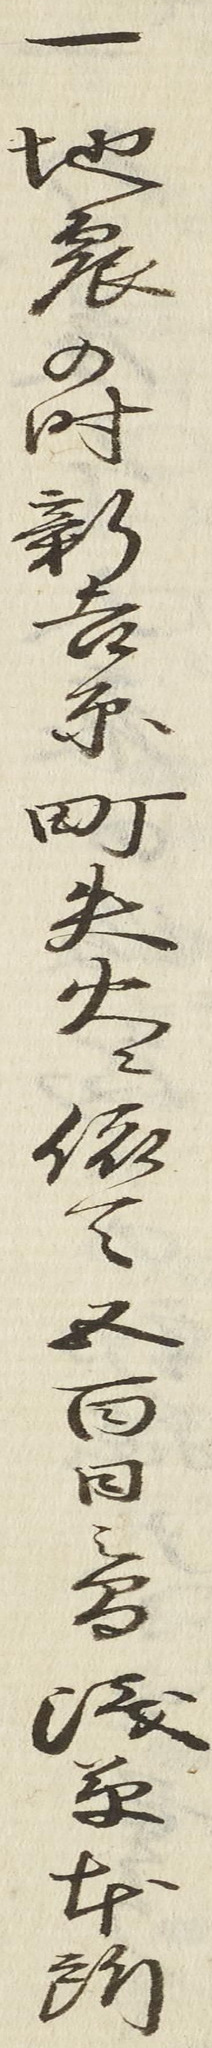一地震の時新吉原町失火に依て五百日之間浅草本所
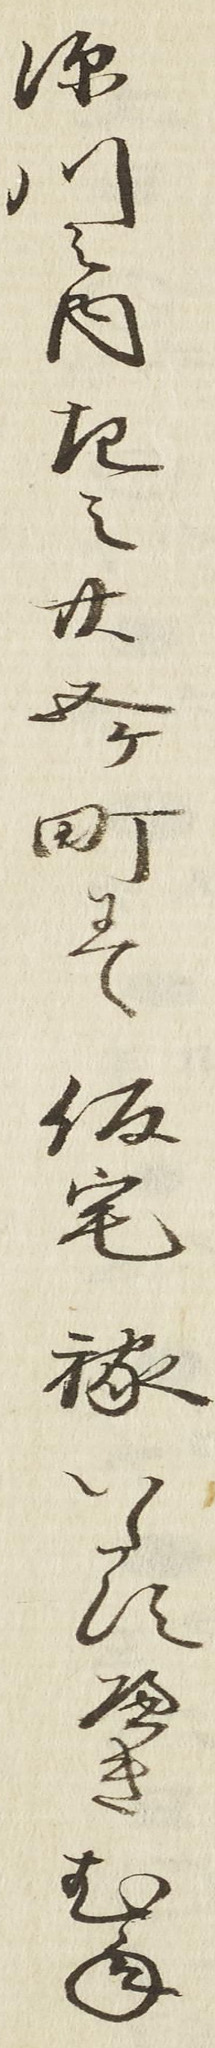深川之内左之廿五ケ町にて仮宅稼いたすへきむね
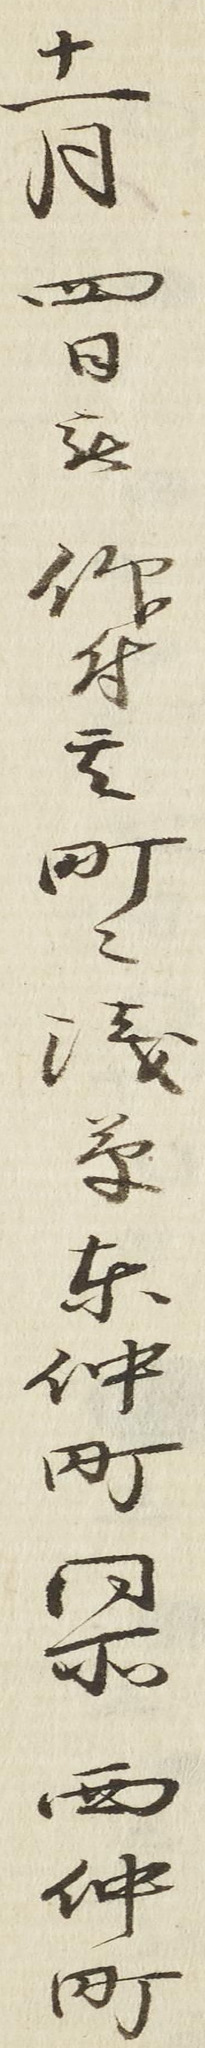十一月四日被仰付其町〻浅草東仲町同所西仲町
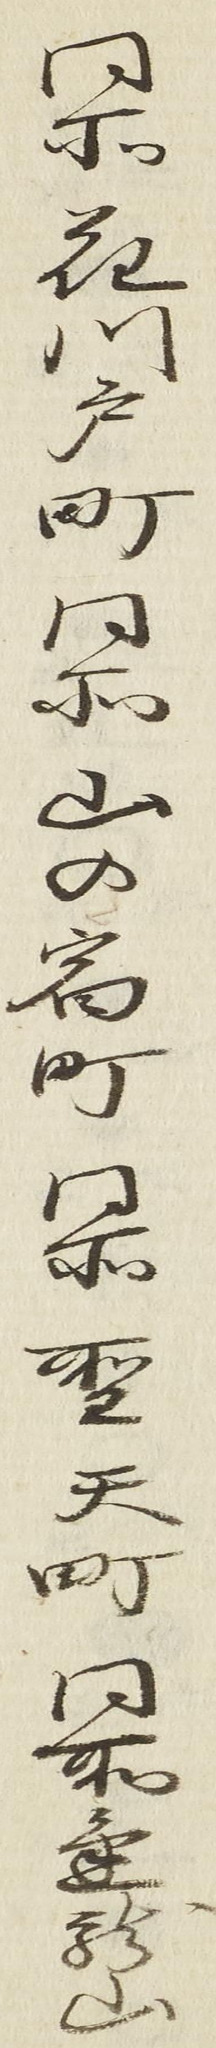同所花川戸町同所山の宿町同所聖天町同所金龍山
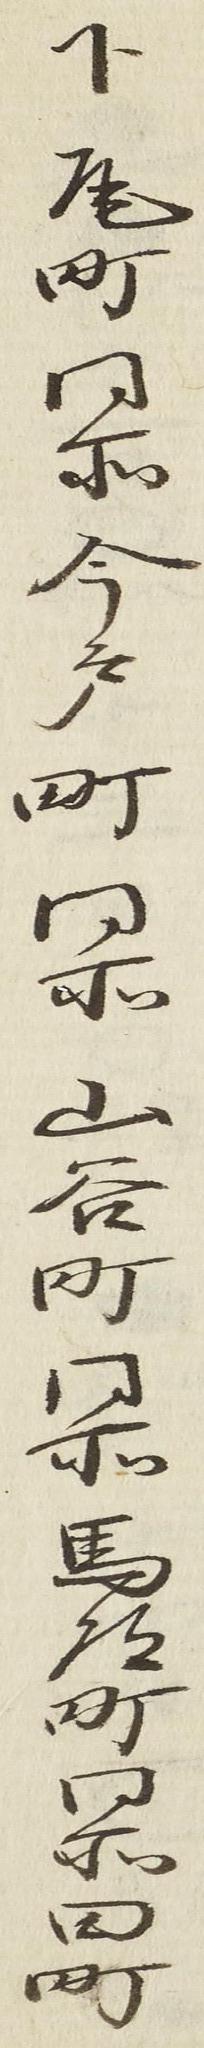下瓦町同所今戸町同所山谷町同所馬道町同所田町
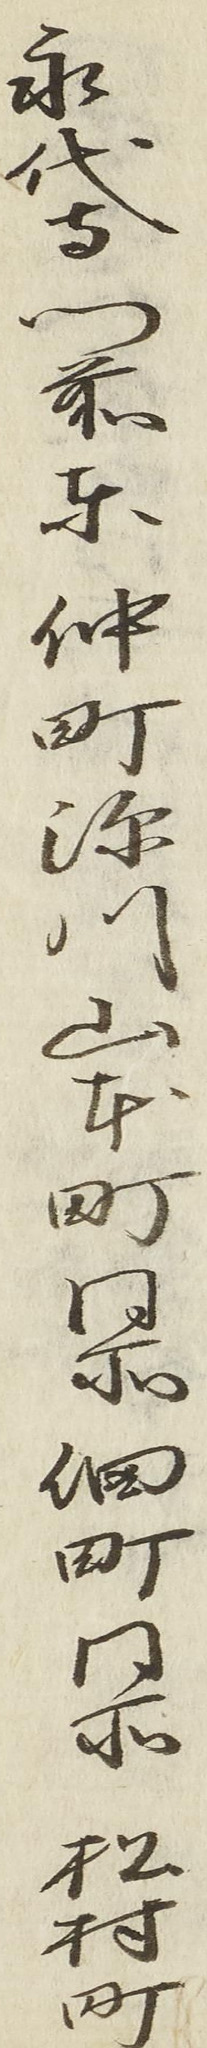永代寺門前東仲町深川山本町同所佃町同所松村町

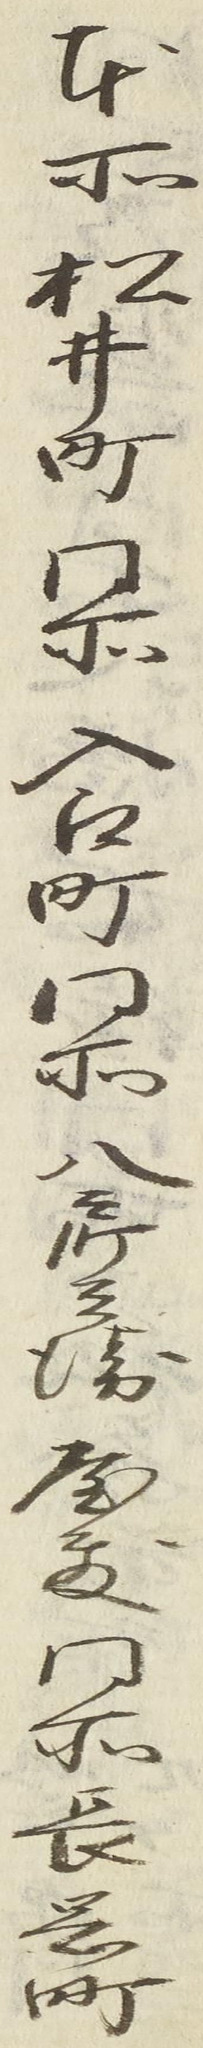本所松井町同所入江町同所八郎兵衛屋敷同所長岡町
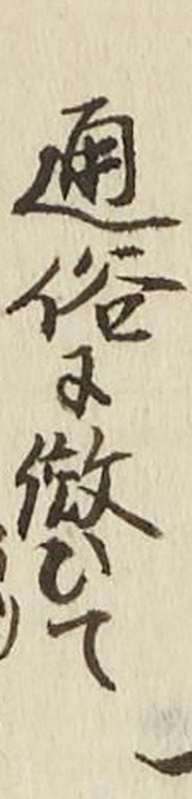通俗に倣ひて
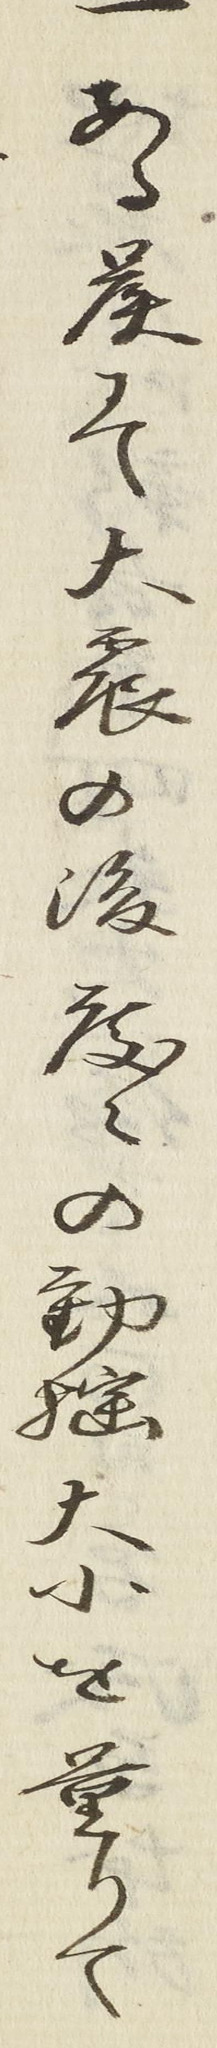一ある侯にて大震の後度〻の動揺大小を量りて
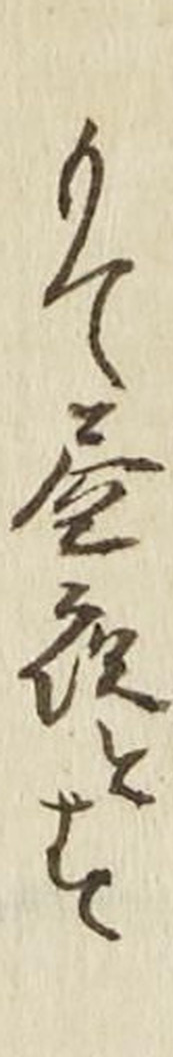もて昼夜とす
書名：やぶれ窓の記　全
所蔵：東京大学地震研究所図書室 Earthquake Research Institute Library, The University of Tokyo, JAPAN
